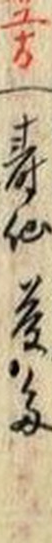寿仙藤多
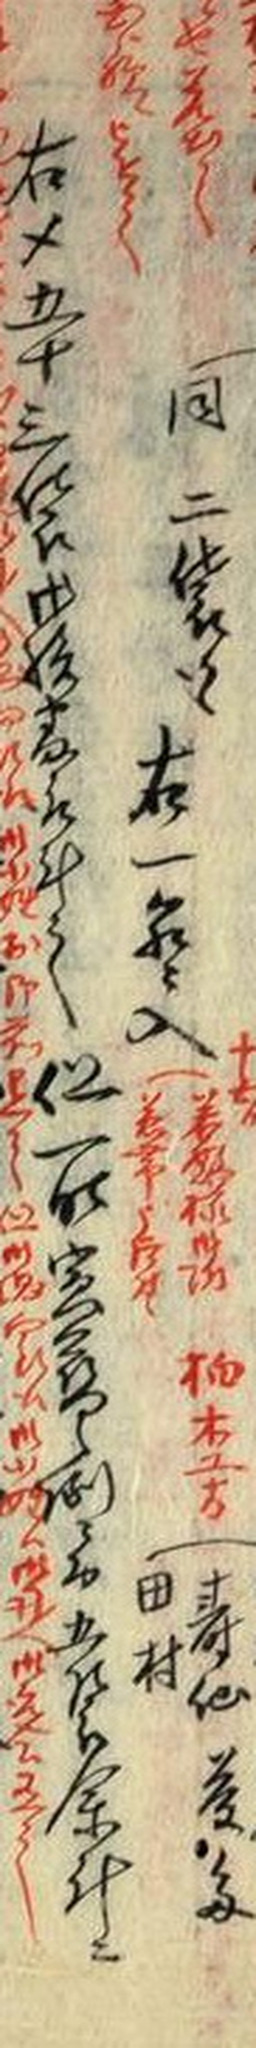右〆五十三袋御膳番取計之但一昨寅暮之例ニ而五袋余計ニ
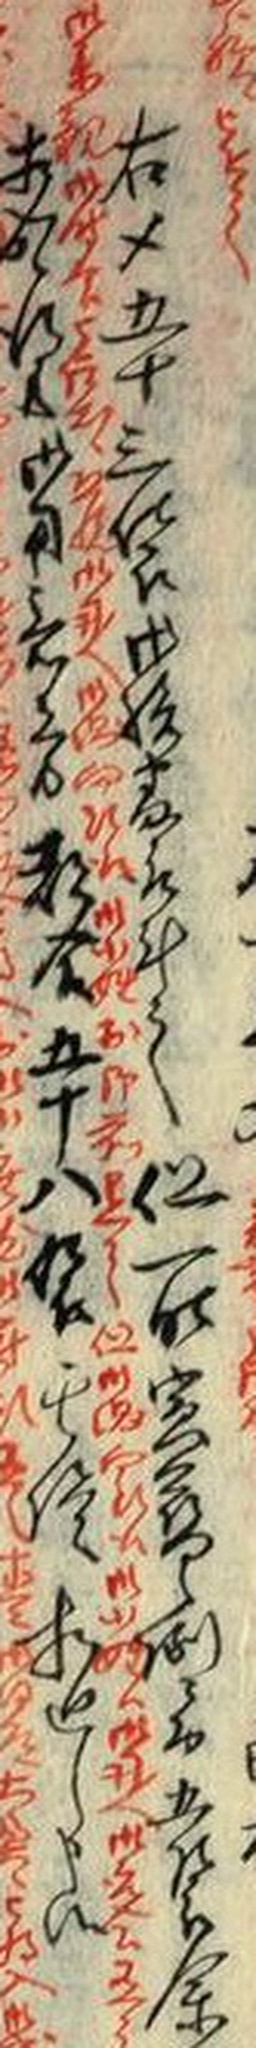相成候得共御用意方都合五十八袋其儘相廻し申候
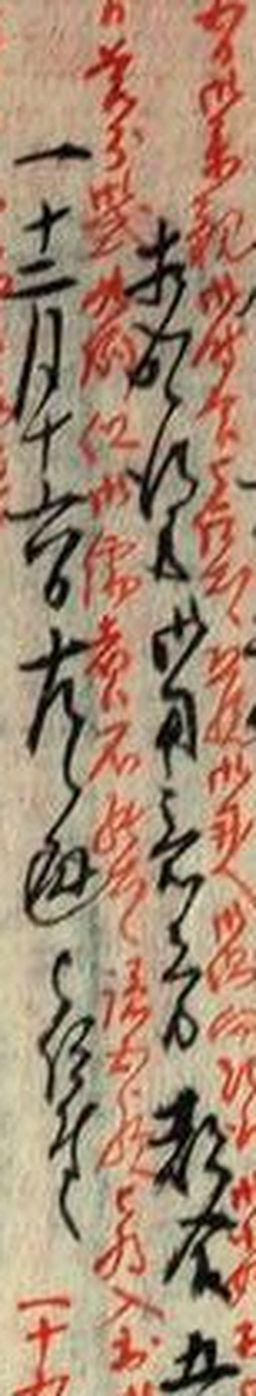一十二月十六日左之通被仰付候
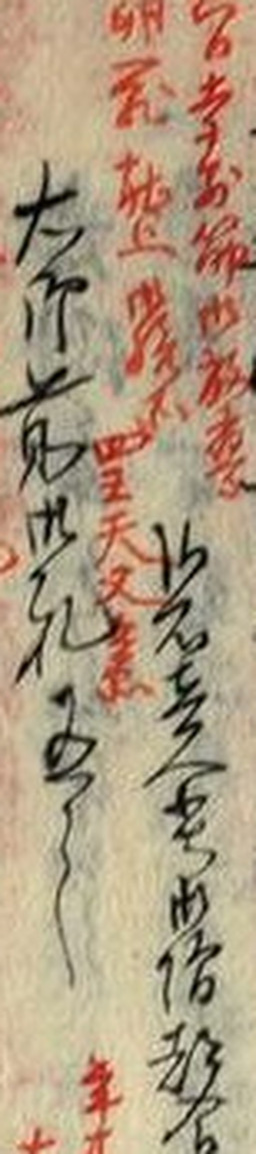右御前御礼有之
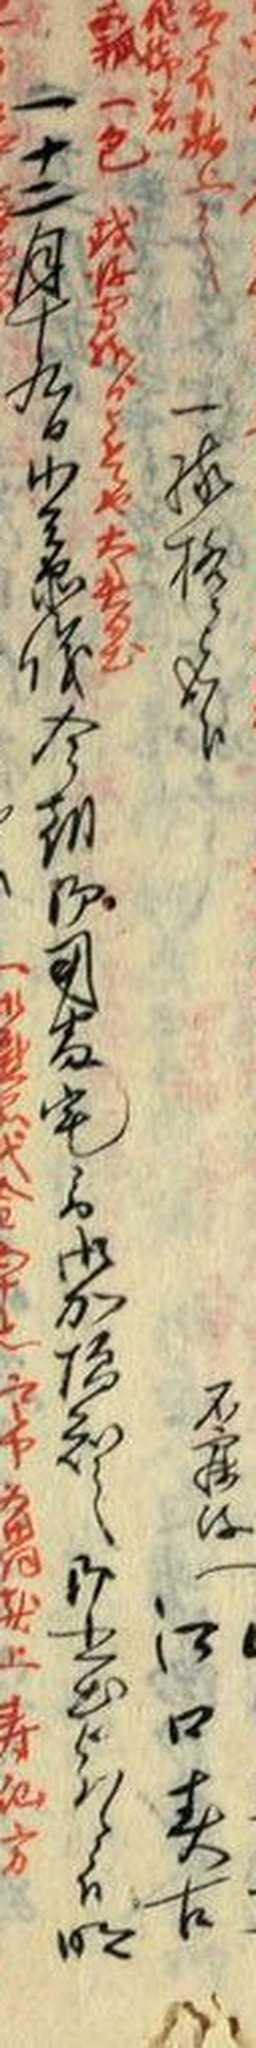一十二月十九日小兵衛儀今朝御用番宅ニ而御加増知之御書出被下候ニ付明
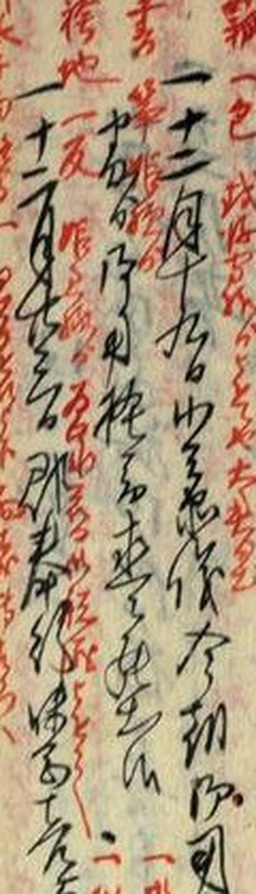番ゟ御用捨ニ而直ニ罷出候
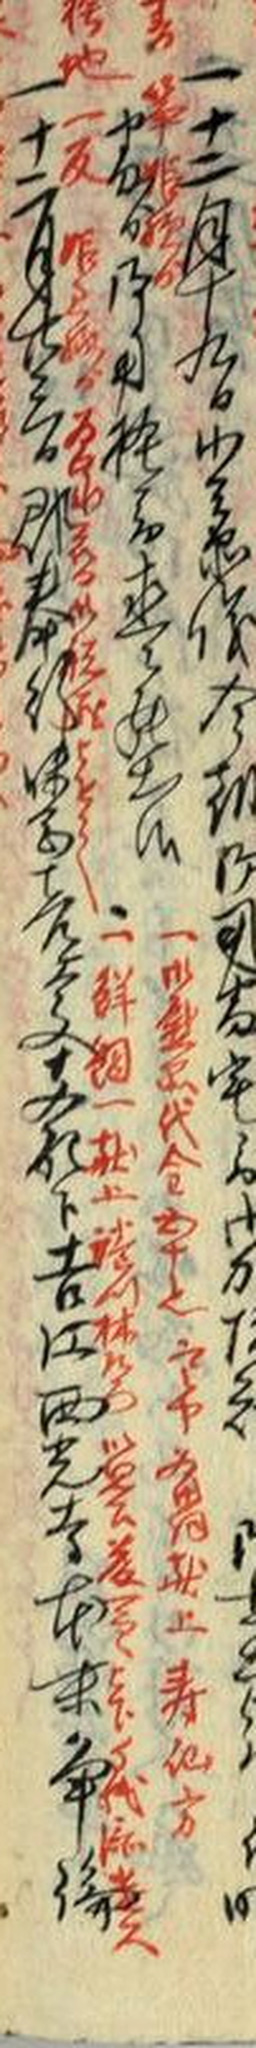一十二月廿三日郡奉行味岡彦太夫支配下吉江西光寺本末争論
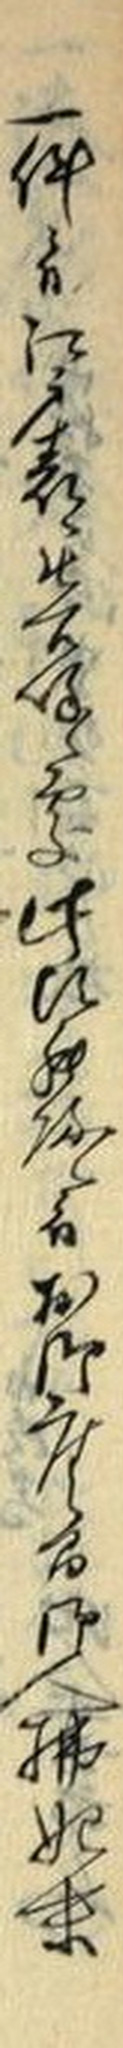一件ニ付江戸表へ被召呼候処此頃罷帰候ニ付於御座之間御人払始末
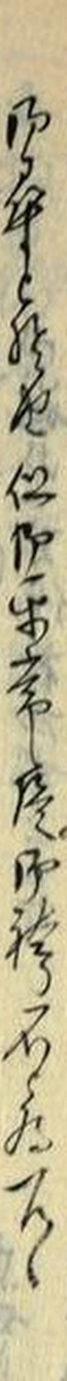御尋被遊候由但御平常之儘御袴不被為召候
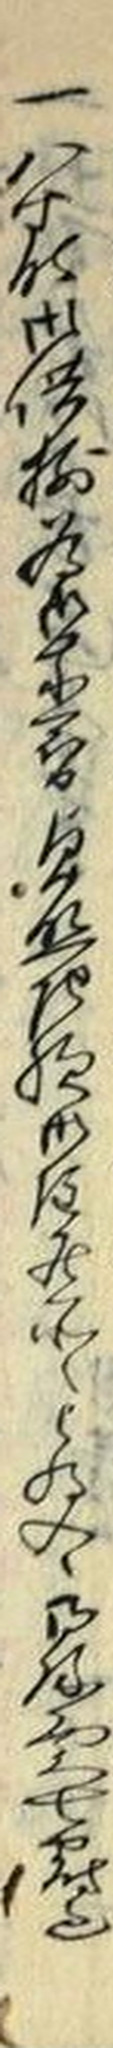一八半時御供揃為御歳暮貞照院様御住居所へ被為入候御帰殿七半時過
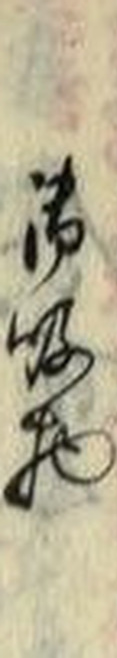御吸物
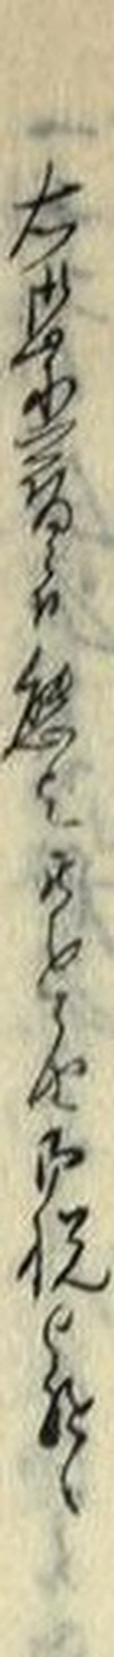右御歳暮ニ付態与被進候由御祝被遊候
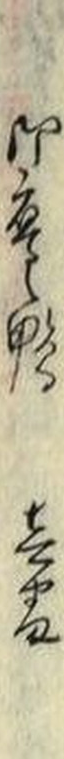御鷹之鴨壱番
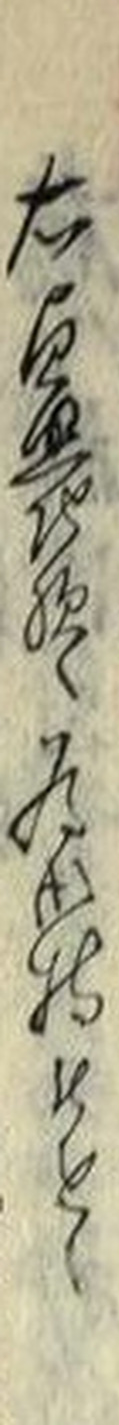右貞照院様へ為御持被進候
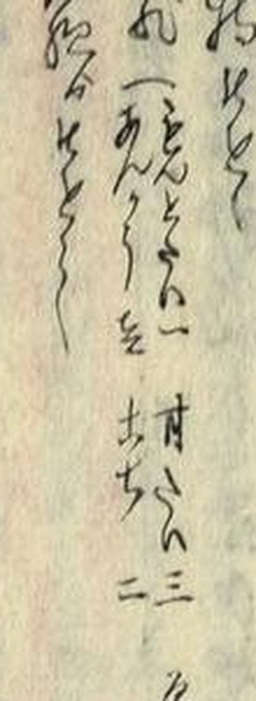あんかう壱こち二
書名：少傅日録抄（斉承付側向頭取日記、在国）
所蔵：福井県文書館 Fukui Prefectural Archives
